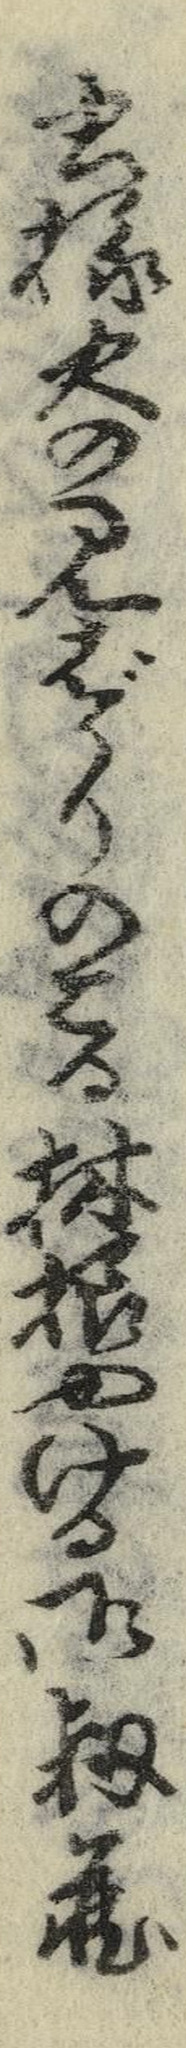書様火の見ばしらのこる林様やける御籾蔵
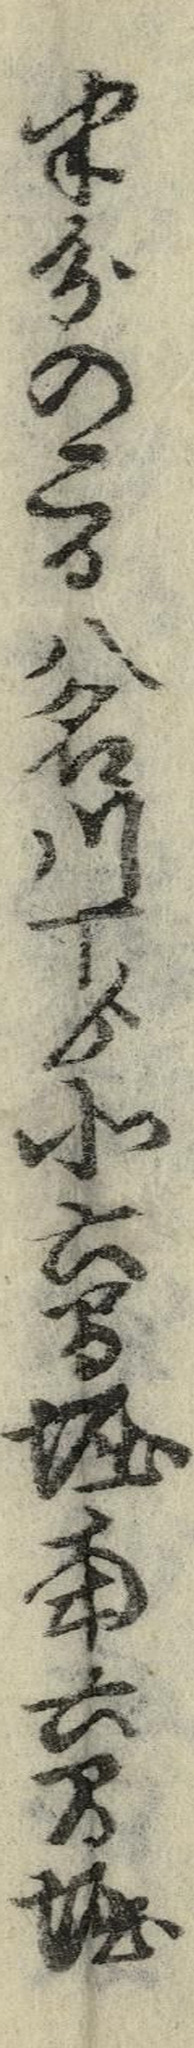半分のこる八名川丁ゟ北六間堀南六間堀
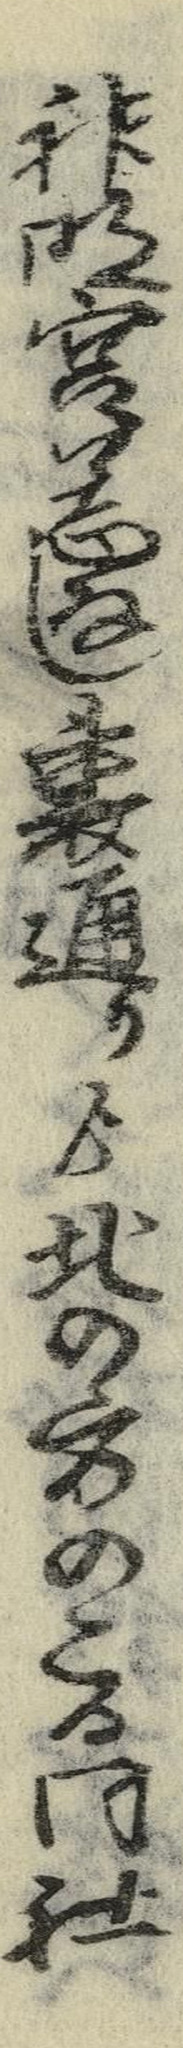神明宮恙なし裏通りゟ北の方のこる同社
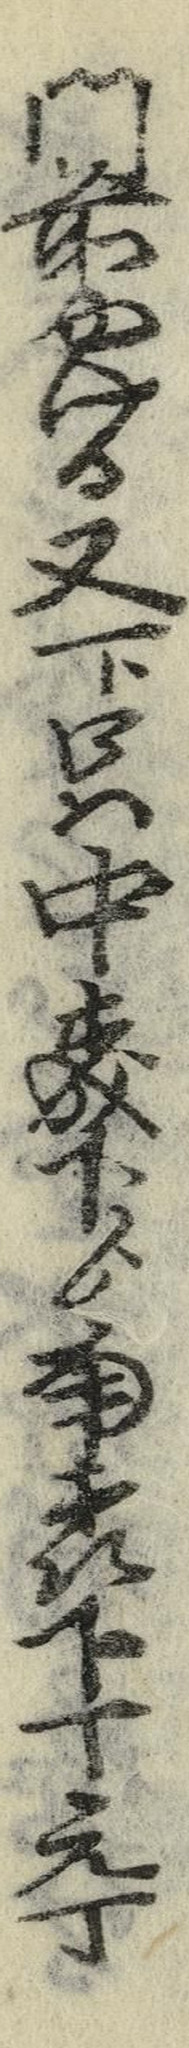門前やける又一ト只中森下ゟ南森下丁元丁
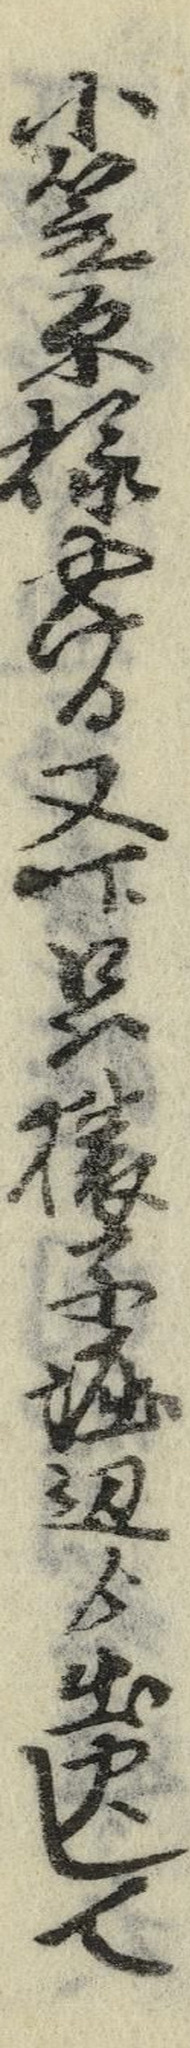小笠原様やける又一ト口は猿子堀辺ゟ出火して
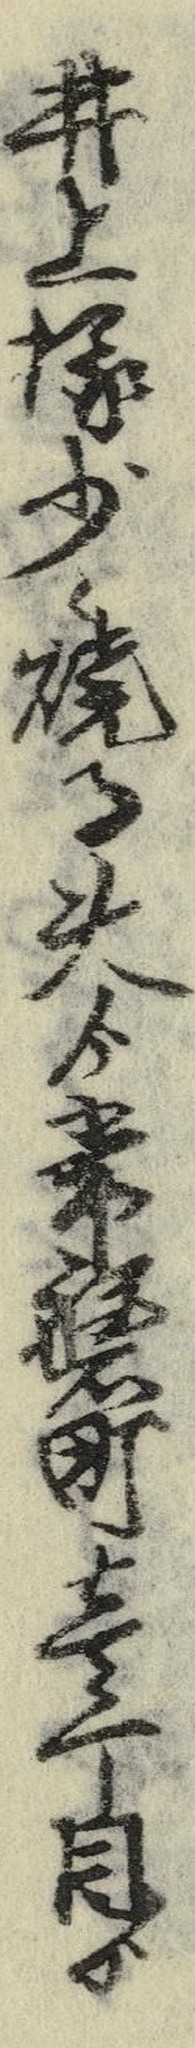井上様少し焼る夫ゟ常磐町壱丁目ゟ
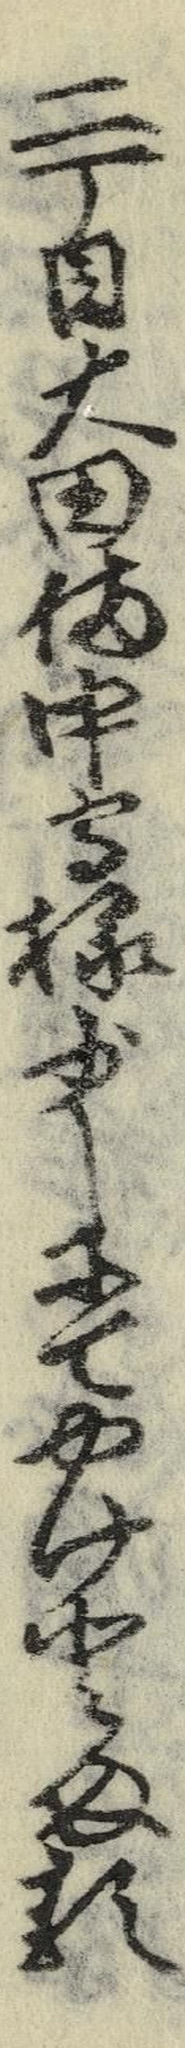二丁目大田備中守様少しにてやけ所々へる
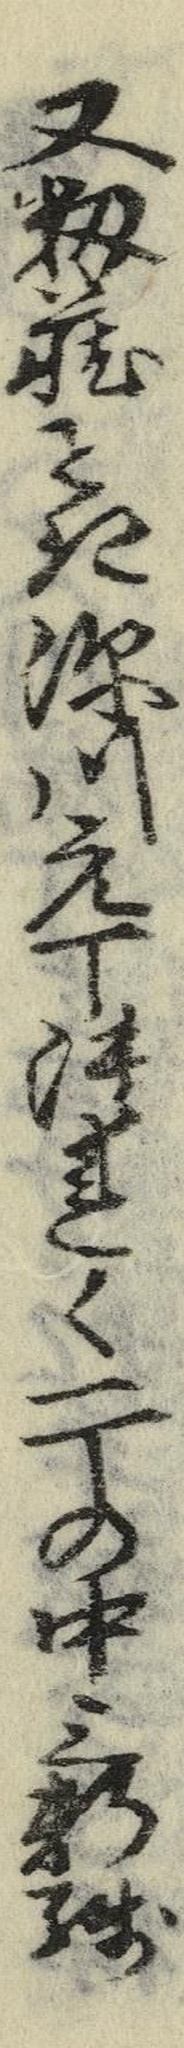又籾蔵ことき深川元丁潰れて一丁の中三軒残
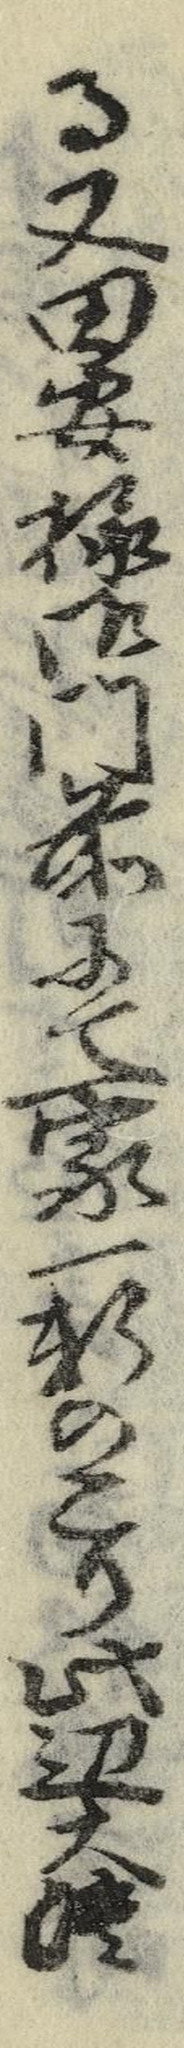る又田安様御門前にて一家一軒のこり此辺大潰
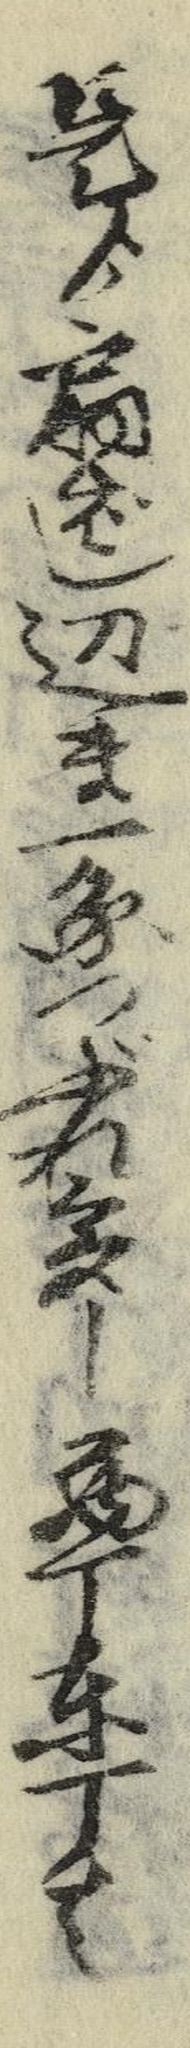是ゟ扇ばし辺ま一円つぶれ多し西丁東丁は
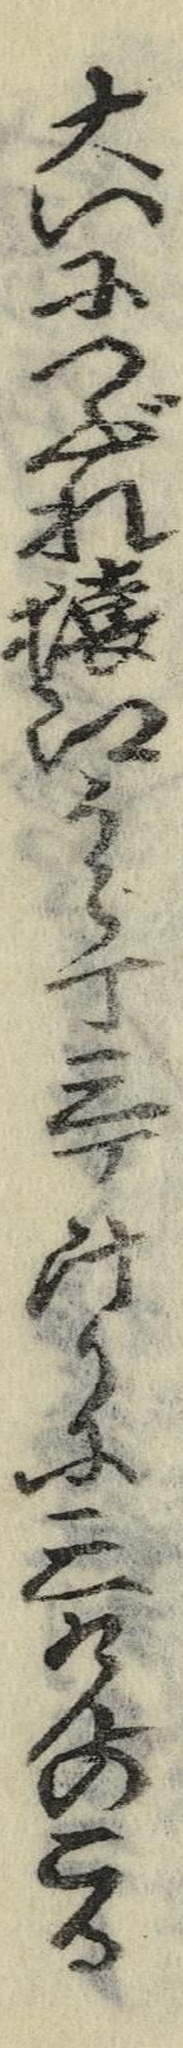大いにつぶれ猿江うら丁三丁計りに三けんのこる
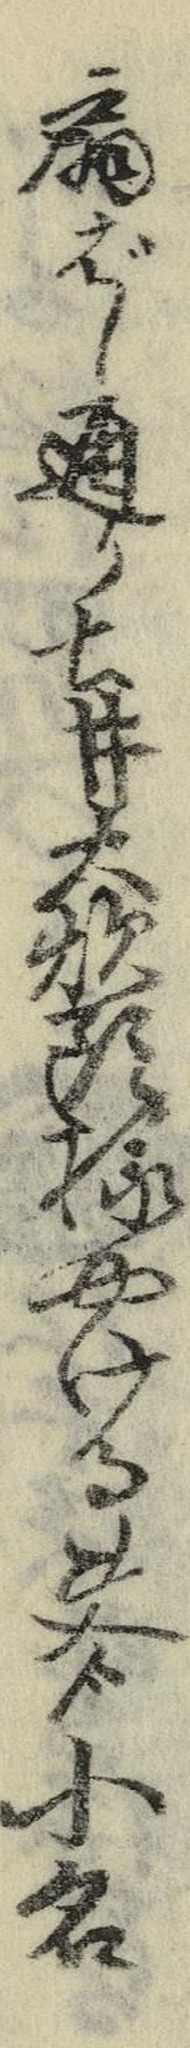扇ばし通り土井大炊頭様やける夫ゟ小名
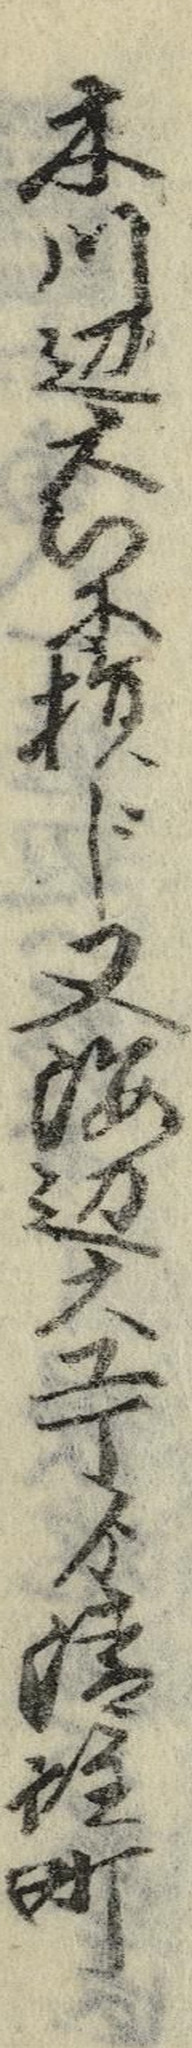木川辺大いに損じ又海辺大工丁ゟ清澄町
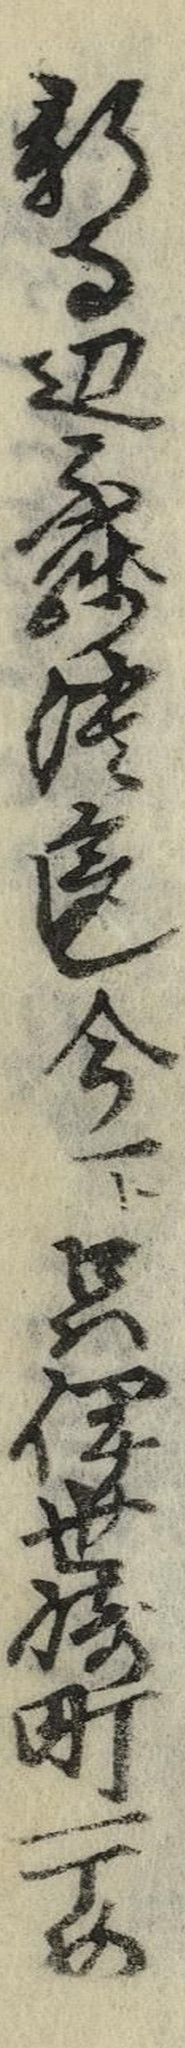新寺辺不残潰多し今一ト口は伊世﨑町一丁め

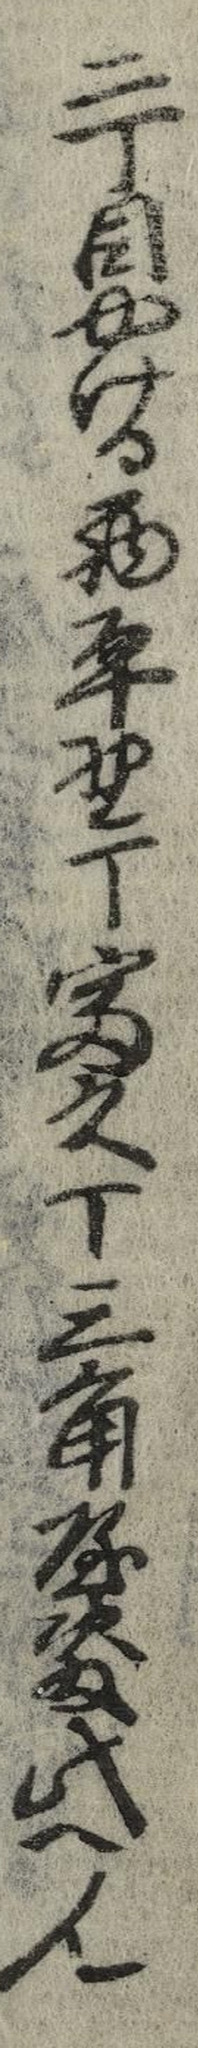二丁目やける西平野丁富久丁三角屋敷此へん
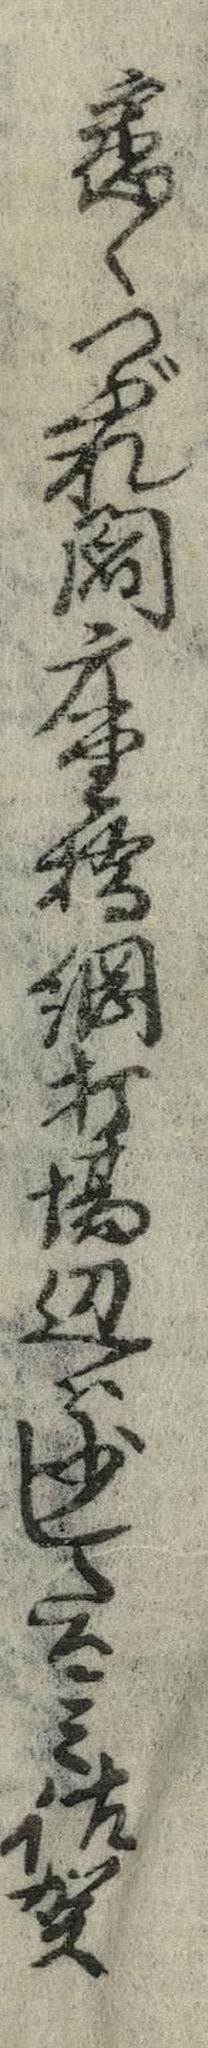悉くつぶれ閣座橋網打場辺は少したるみ佐賀
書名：地震類焼場所明細書之写　安政二卯年十月二日夜四ツ時過　御府内御屋敷方市中共、并街道筋近郷聞書
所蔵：東京大学地震研究所図書室 Earthquake Research Institute Library, The University of Tokyo, JAPAN
